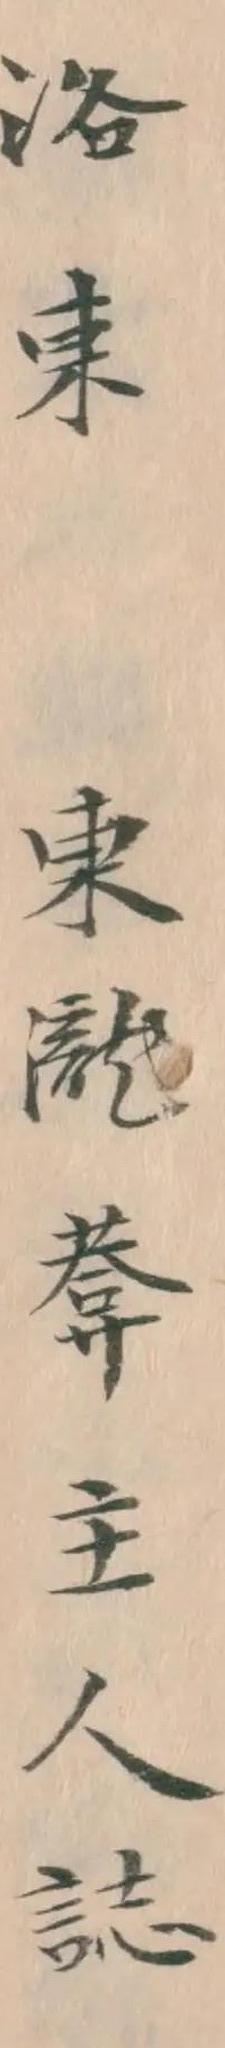洛東東瀧葊主人誌

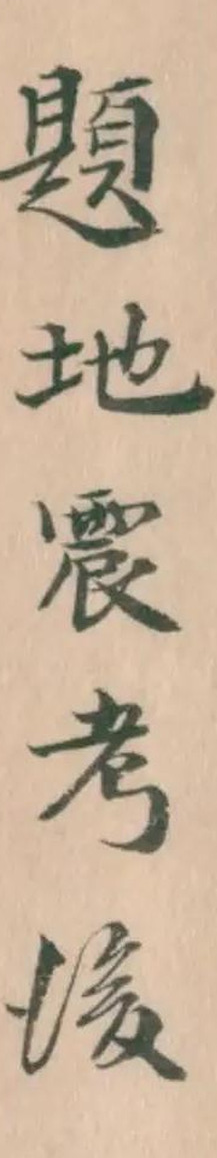題地震考後

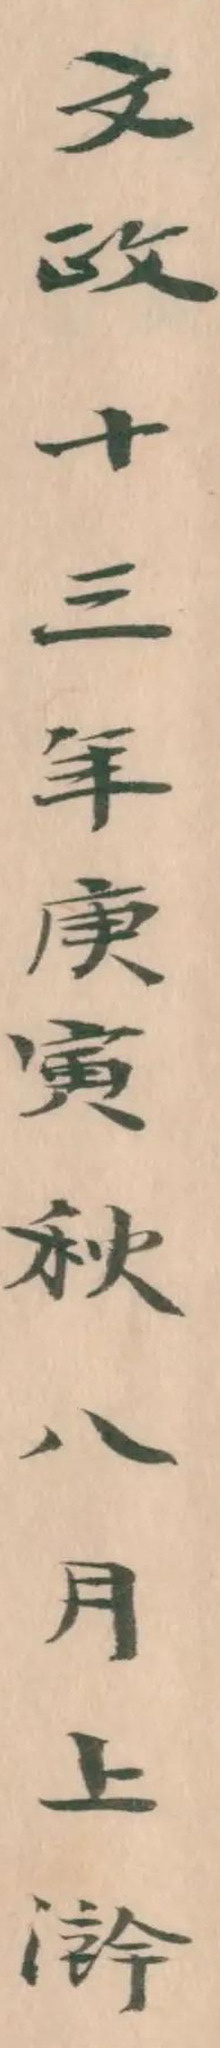文政十三年庚寅秋八月上澣
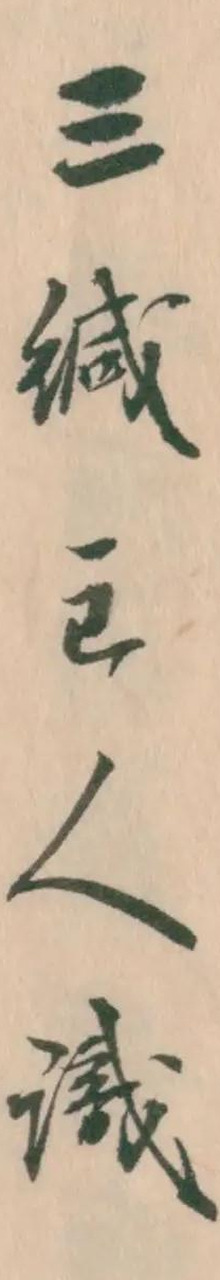三緘主人識
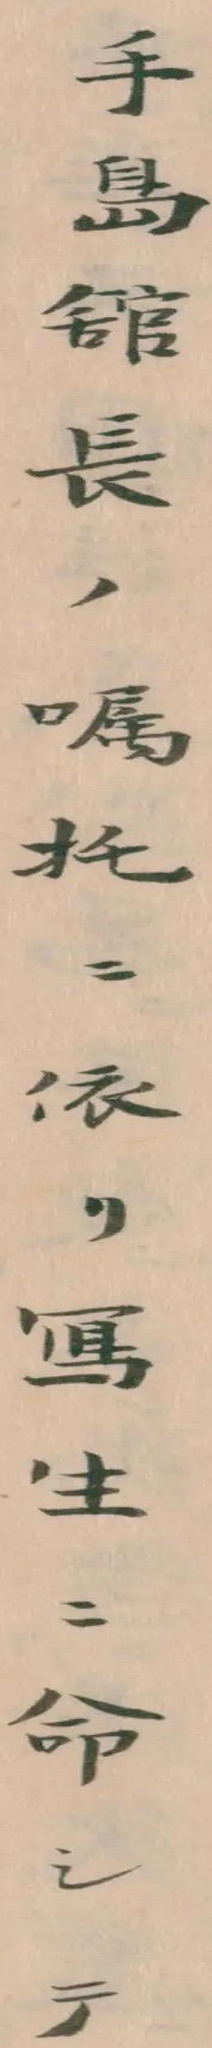手嶋舘長ノ嘱托ニ依リ写生ニ命シテ
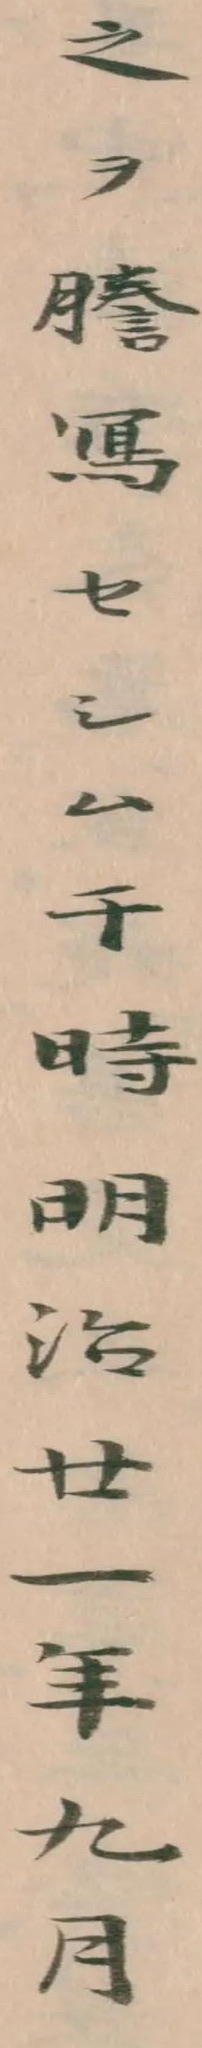之ヲ謄写セシム于時明治廿一年九月
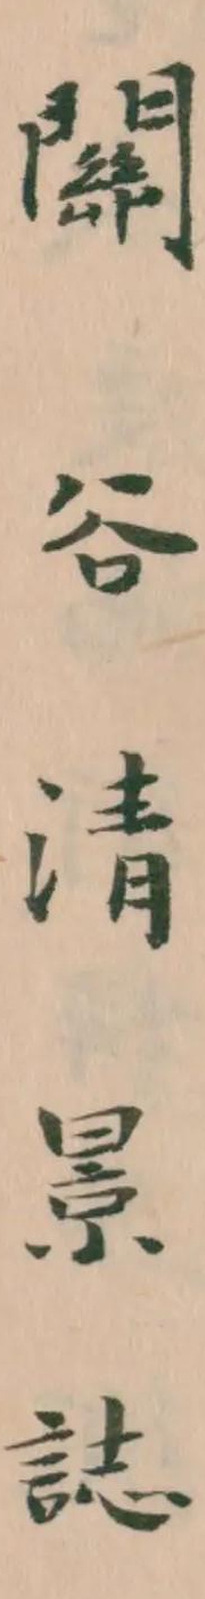関谷清景誌

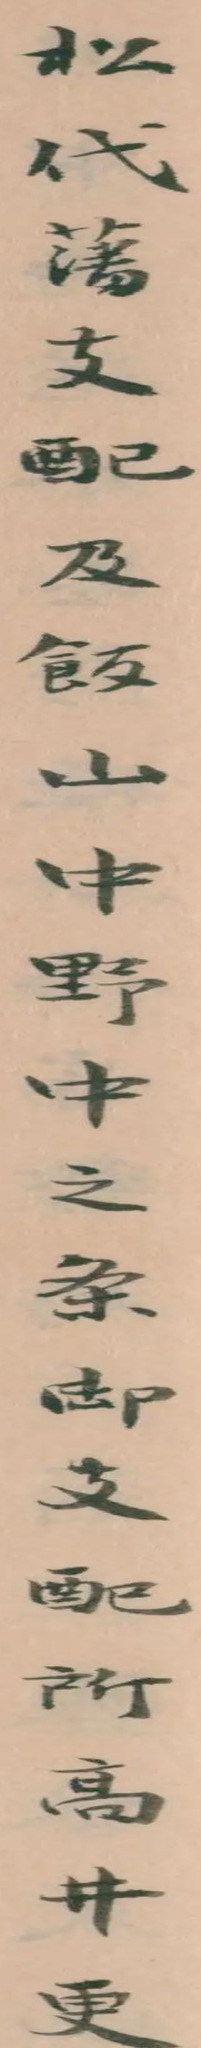松代藩支配及飯山中野中之条御支配所高井更
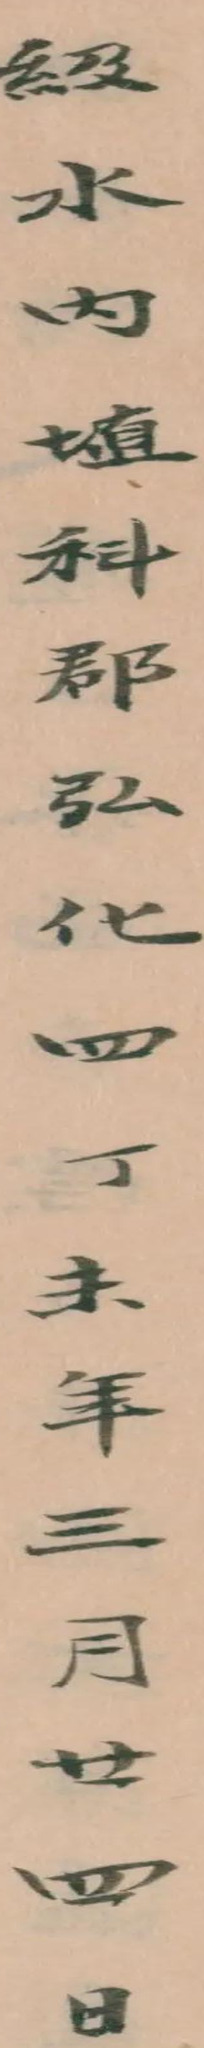級水内埴科郡弘化四丁未年三月廿四日
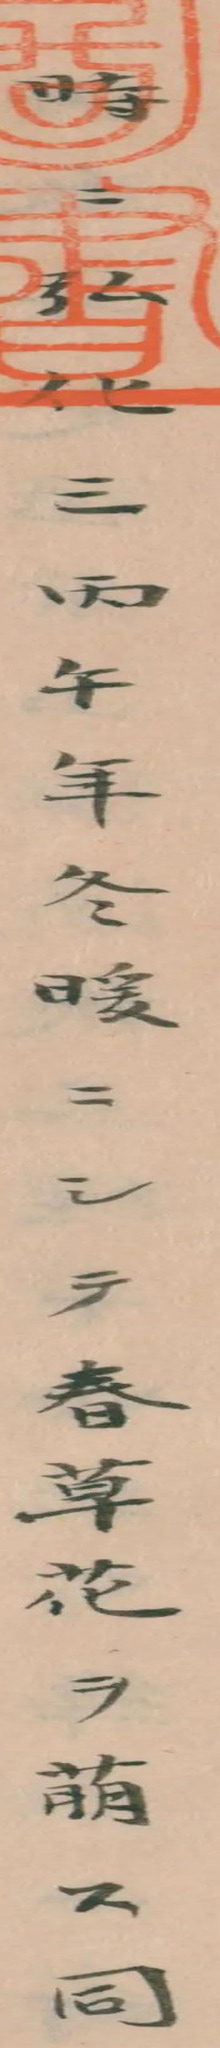時ニ弘化三丙午年冬暖ニシテ春草花ヲ萌ス同
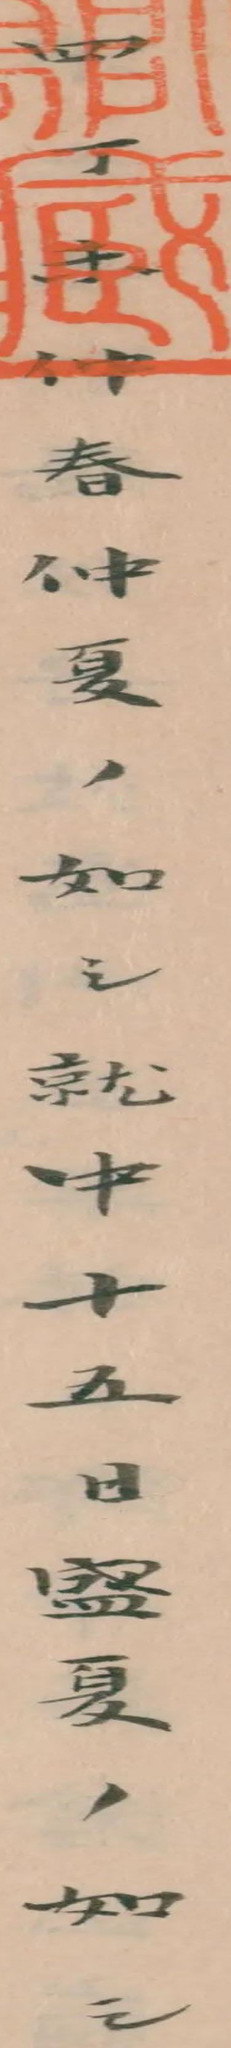四丁未仲春仲夏ノ如シ就中十五日盛夏ノ如シ
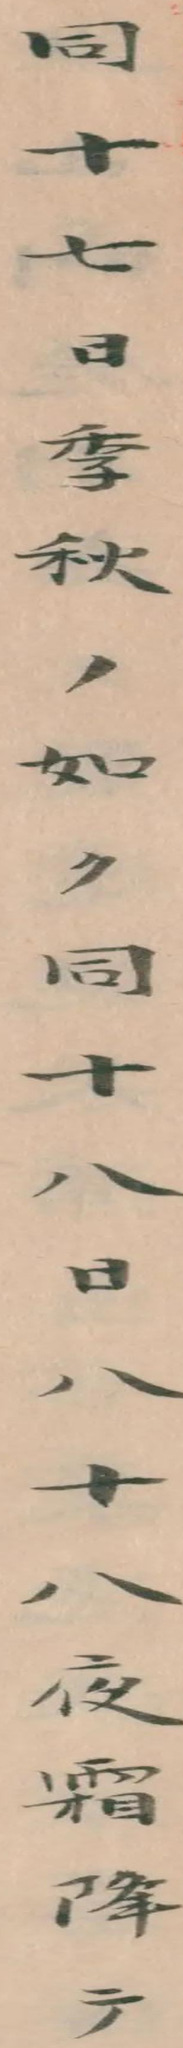同十七日季秋ノ如ク同十八日八十八夜霜降テ
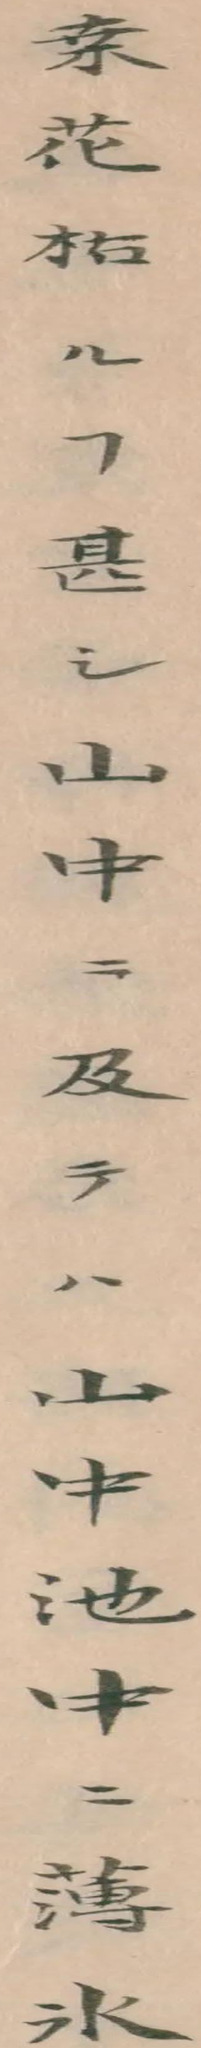桑花枯ルコト甚シ山中ニ及テハ山中池中ニ薄氷
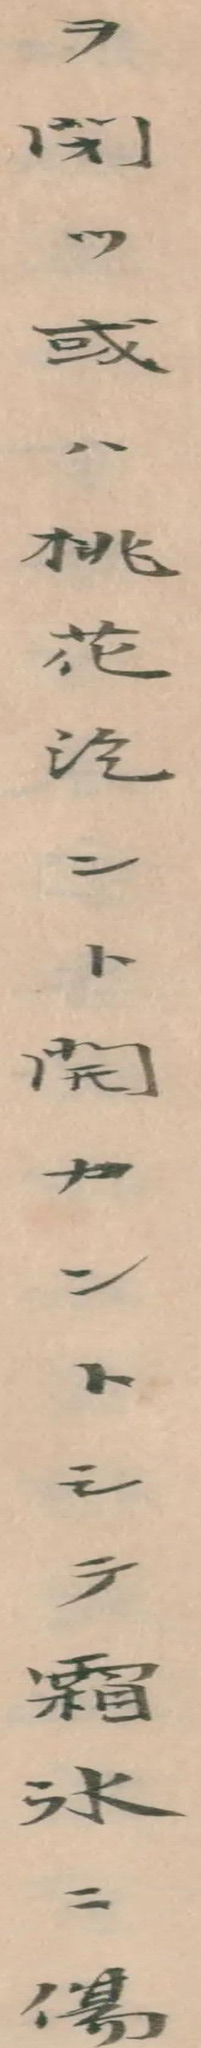ヲ閉ツ或ハ桃花汔ント開カントシテ霜氷ニ傷
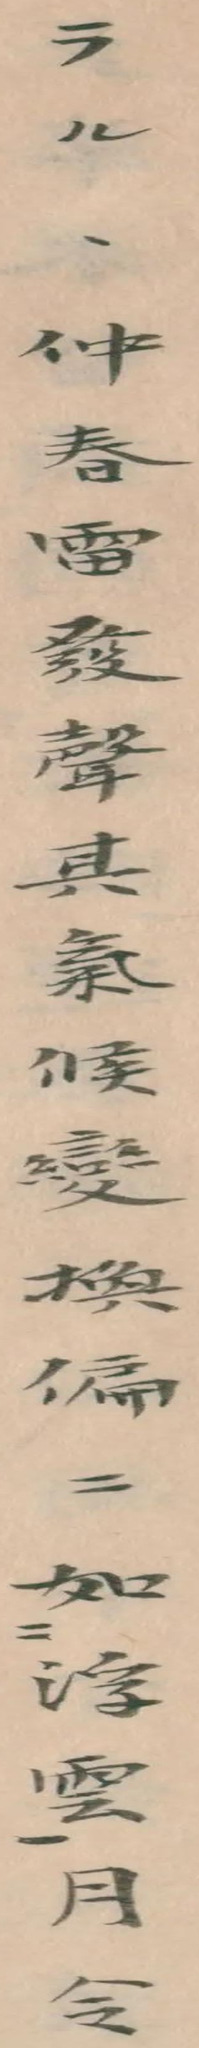ラルヽ仲春雷発声其気候変換偏ニ如浮雲月令

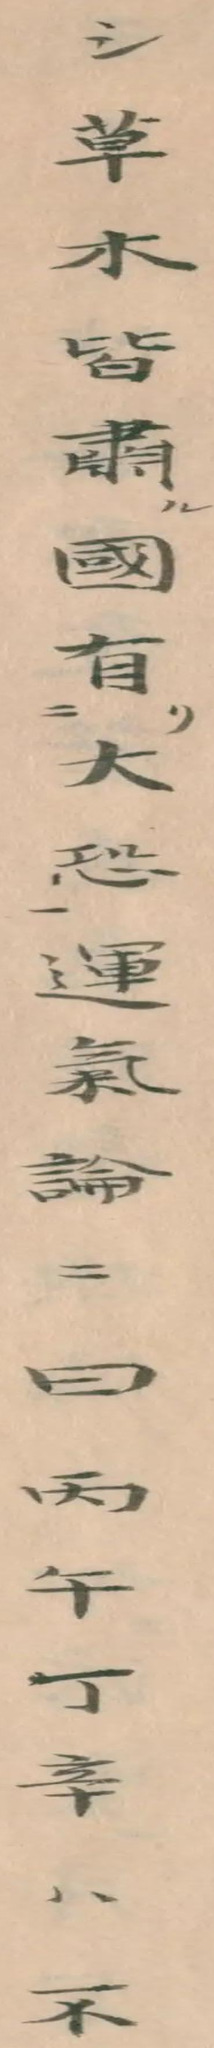シ草木皆粛国有大恐運気論ニ曰丙午丁辛ハ不
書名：地災撮要. 巻5-6(地震之部)
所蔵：国立国会図書館 National Diet Library, JAPAN
